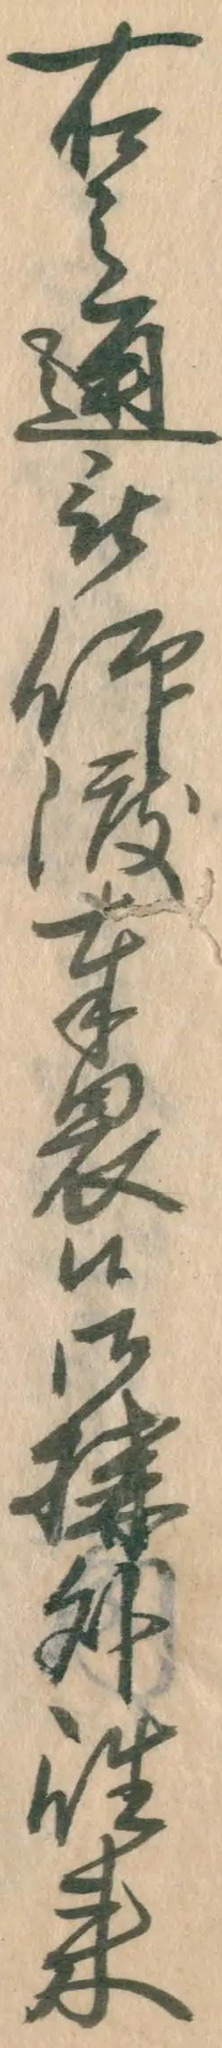右之通被仰渡奉畏候御構外往来
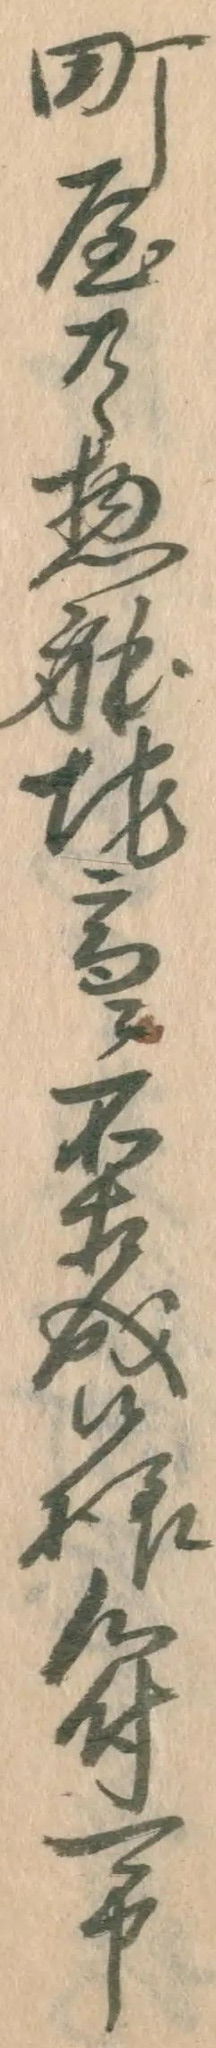町屋共惣体地高ニ不相成候様心付可申
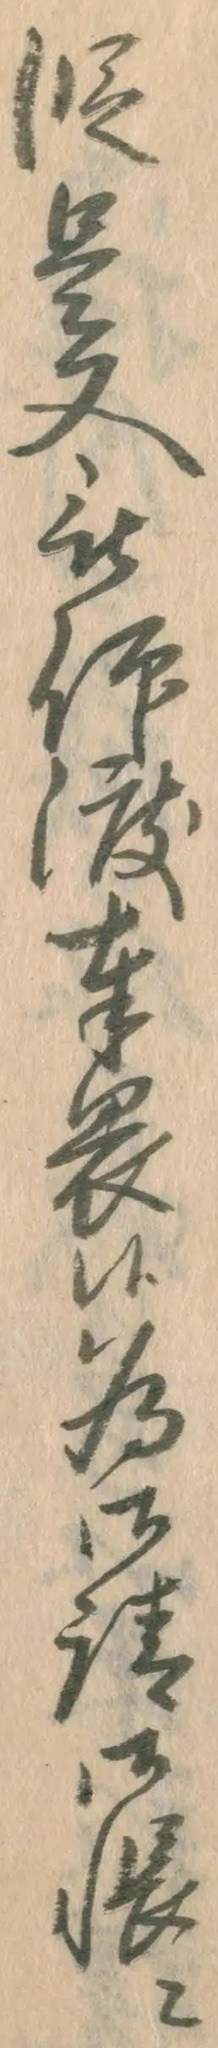段是又被仰渡奉畏候為御請御帳ニ
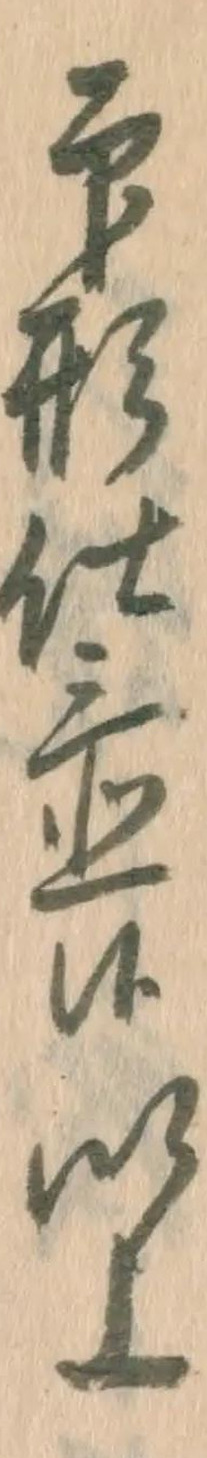印形仕置候以上
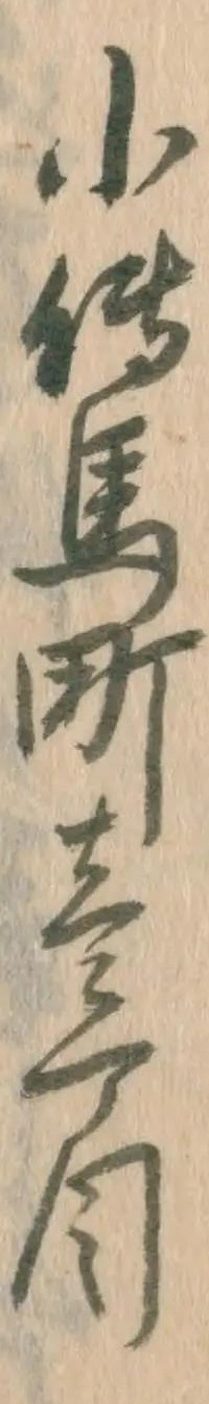小伝馬町壱丁目
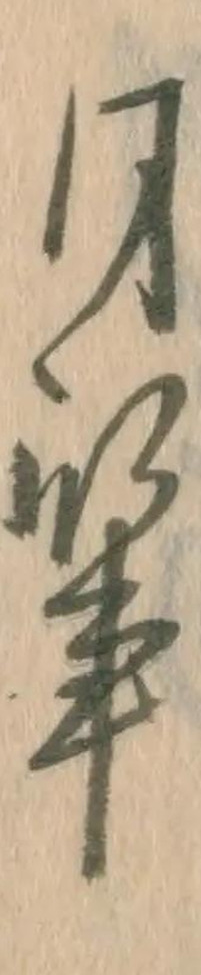月行事
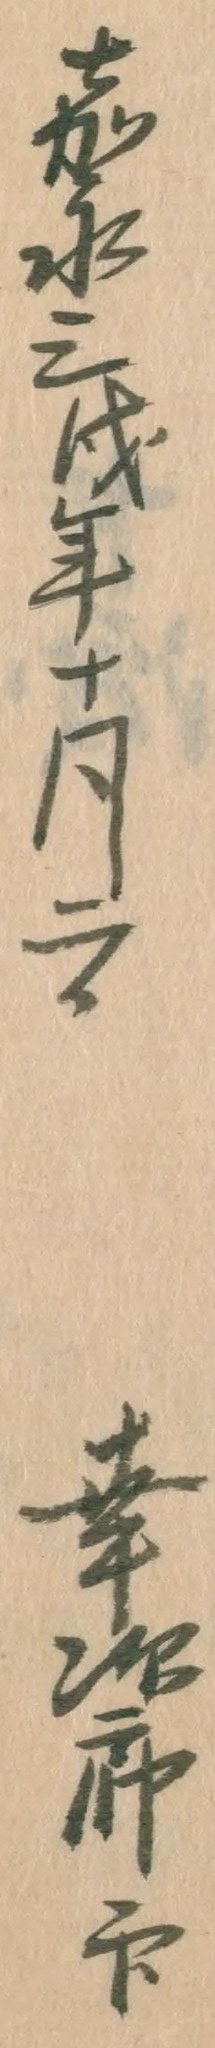嘉永三戌年十月二日幸次郎印
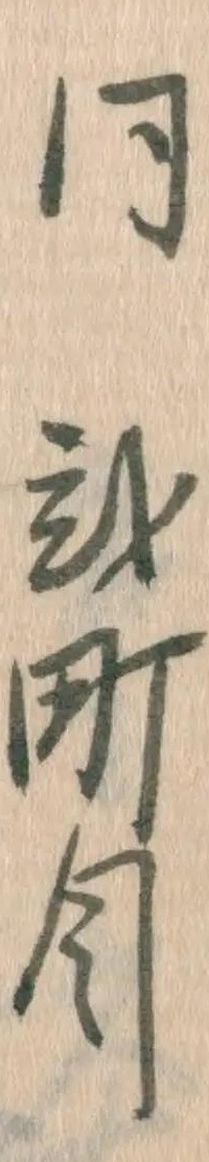同弐丁目
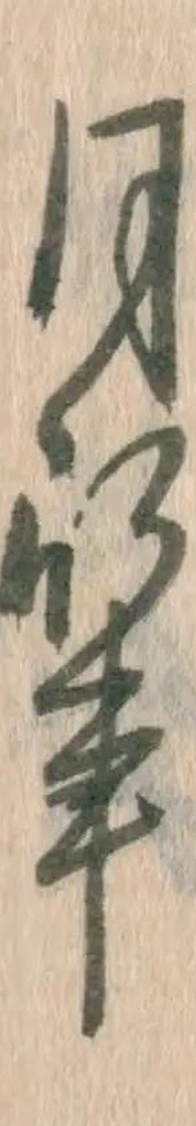月行事
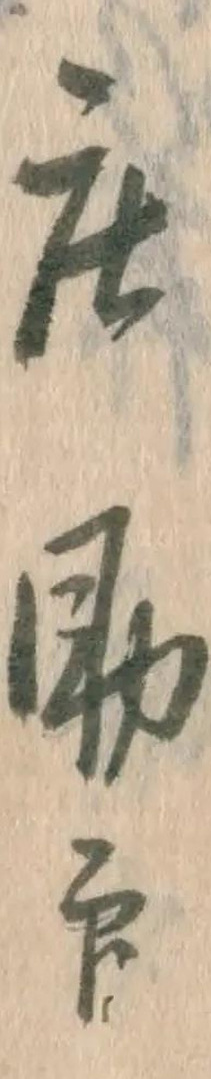庄助印
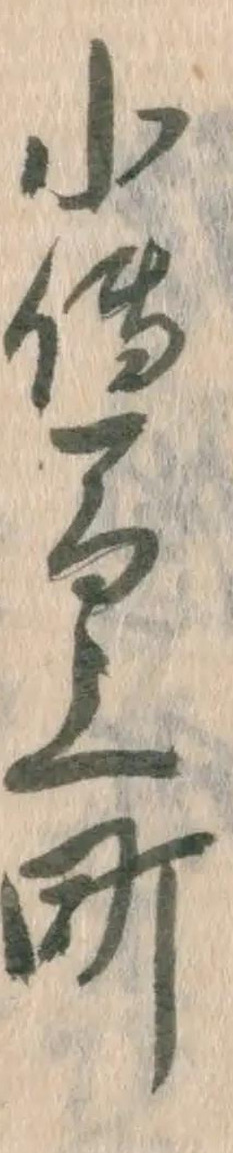小伝馬上町
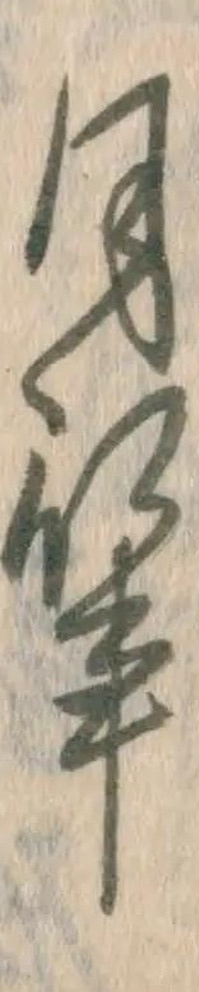月行事
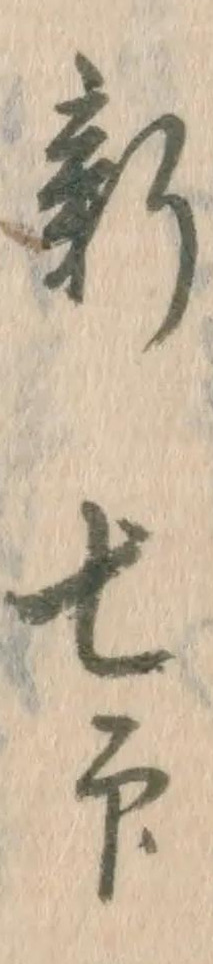新七印
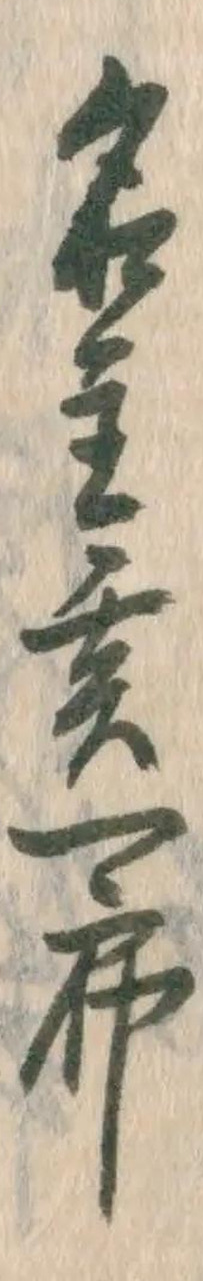名主亥一郎
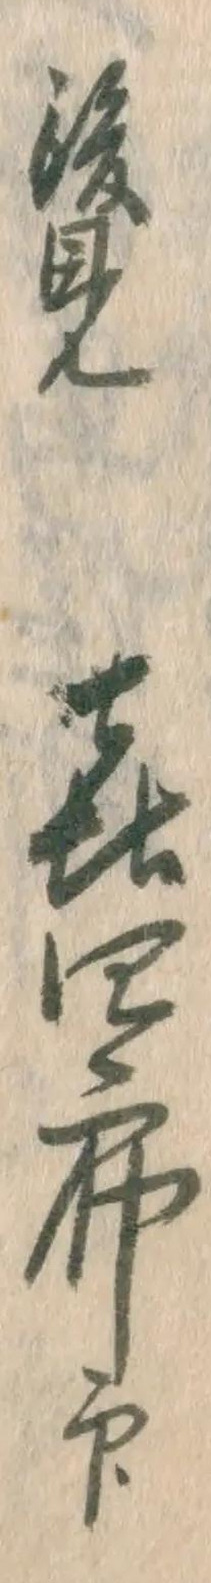後見喜四郎印
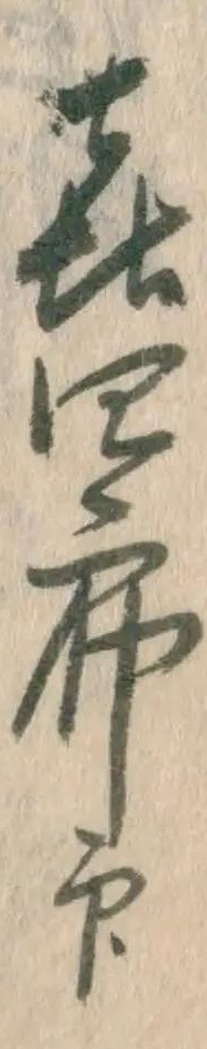後見喜四郎印
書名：七十冊物類集 71巻. [44] 四十三 牢屋敷御普請御修覆地震ニ付骨折候牢屋掛御褒美之部
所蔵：国立国会図書館 National Diet Library, JAPAN
